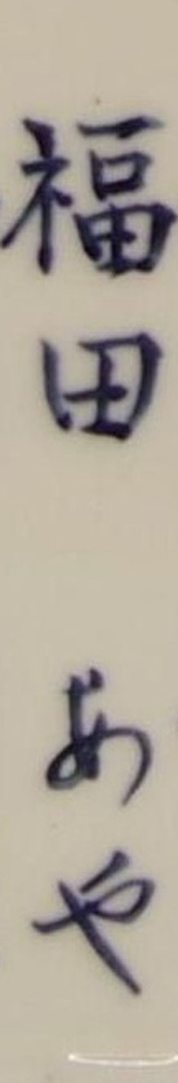福田あや
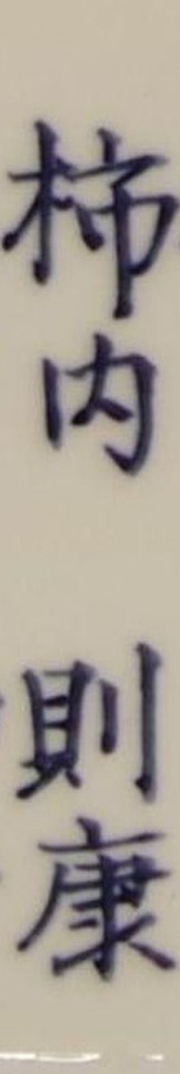柿内則康
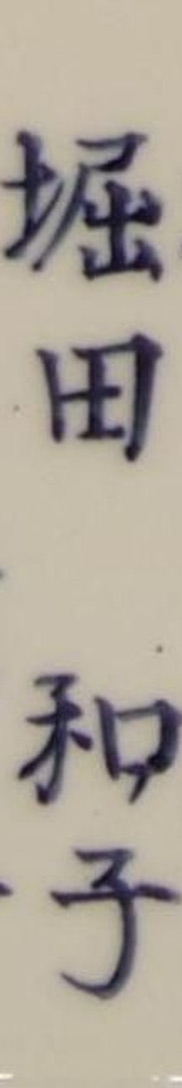堀田和子
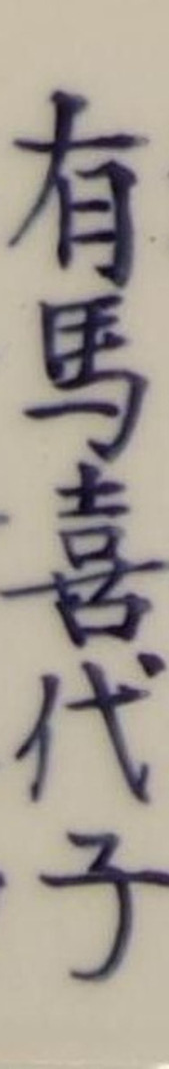有馬喜代子
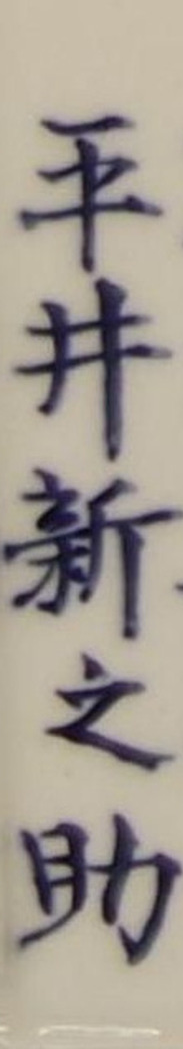平井新之助

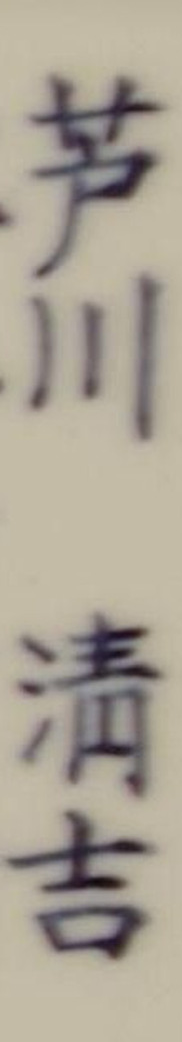芦川清吉
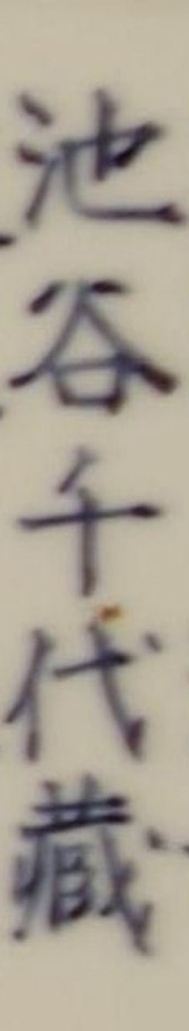池谷千代蔵
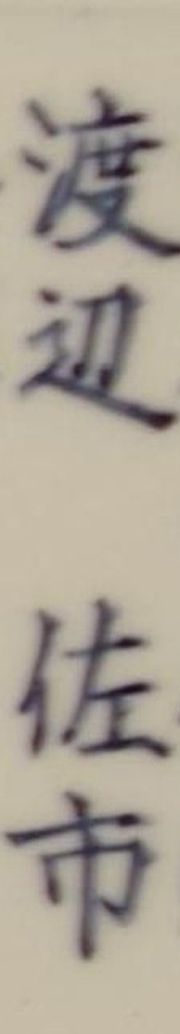渡辺佐市
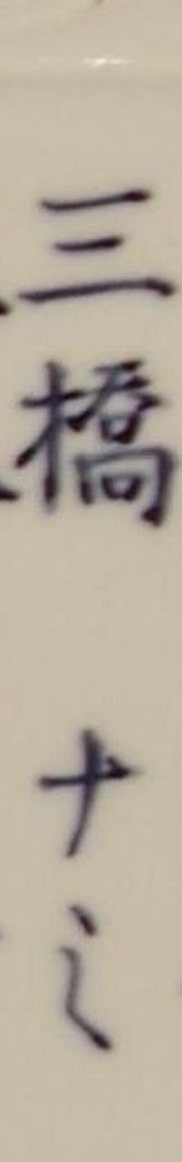三橋ナミ
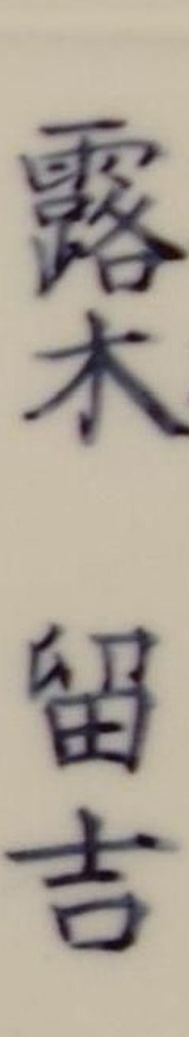露木留吉
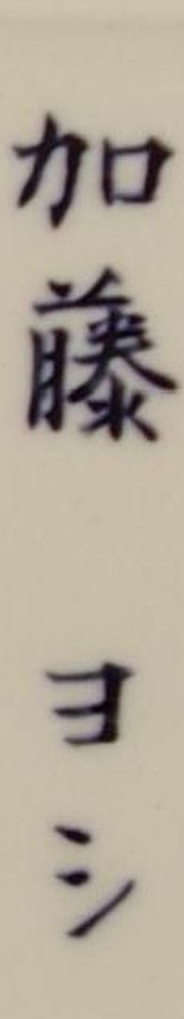加藤ヨシ
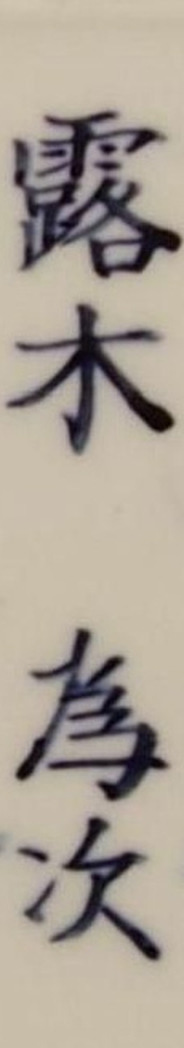露木為次
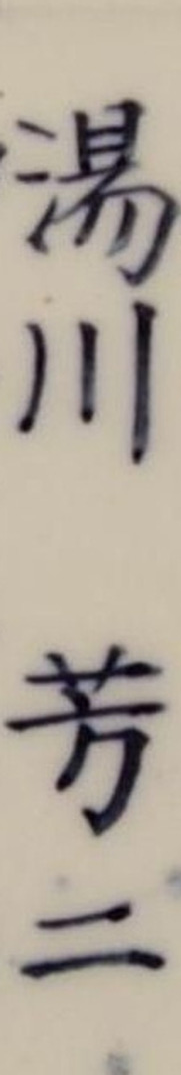湯川芳二
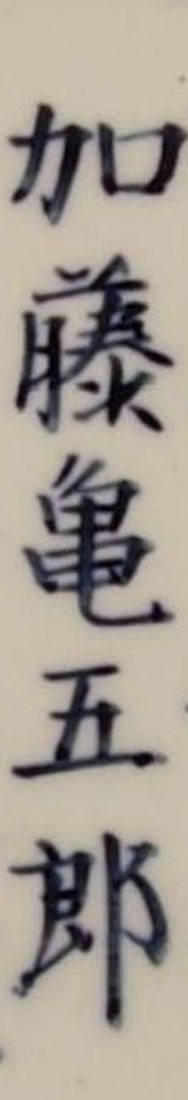加藤亀五郎
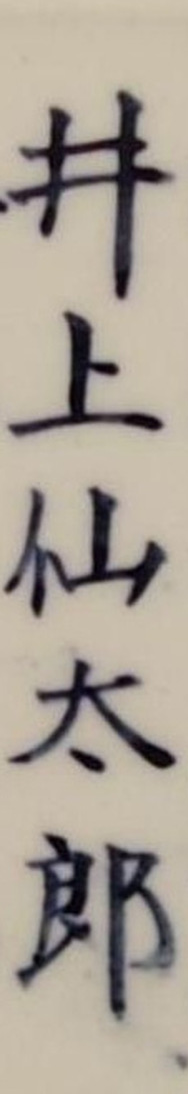井上仙太郎
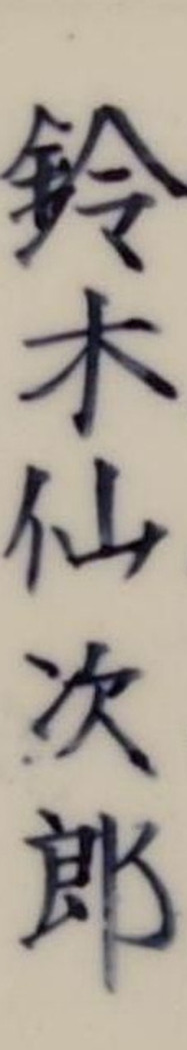鈴木仙次郎
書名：E~L
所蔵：高野山金剛峯寺
